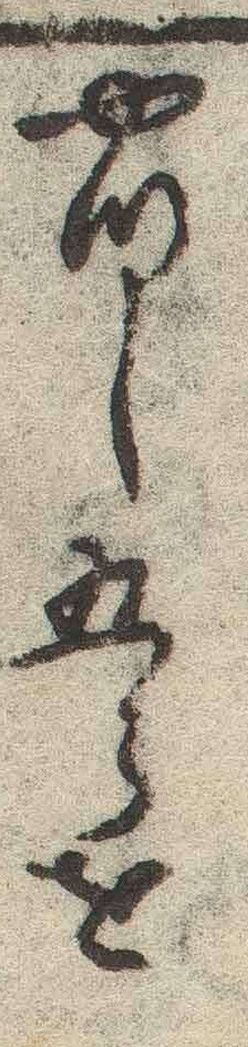やつし五郎を
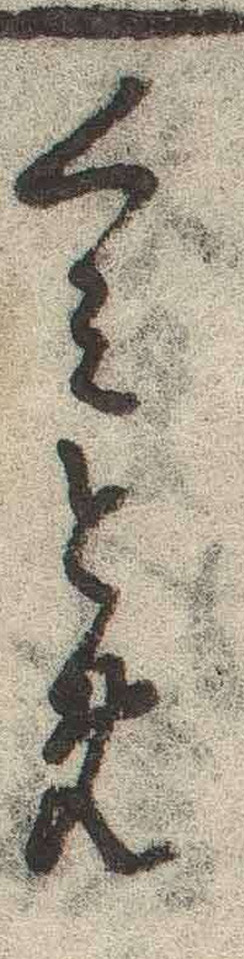くみとめ
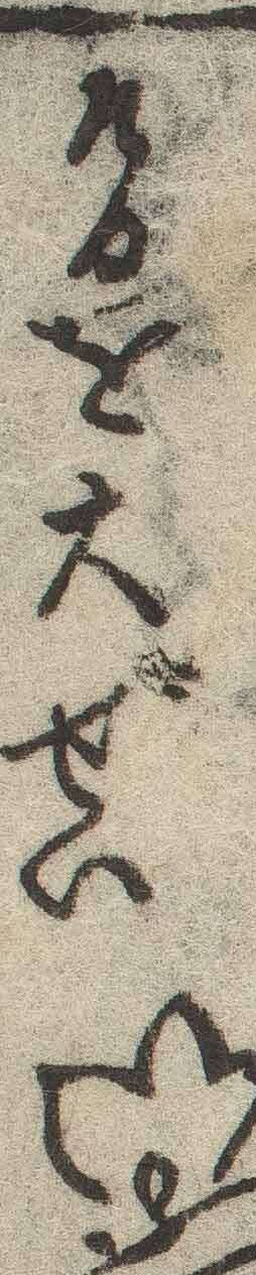けるを大ぜい
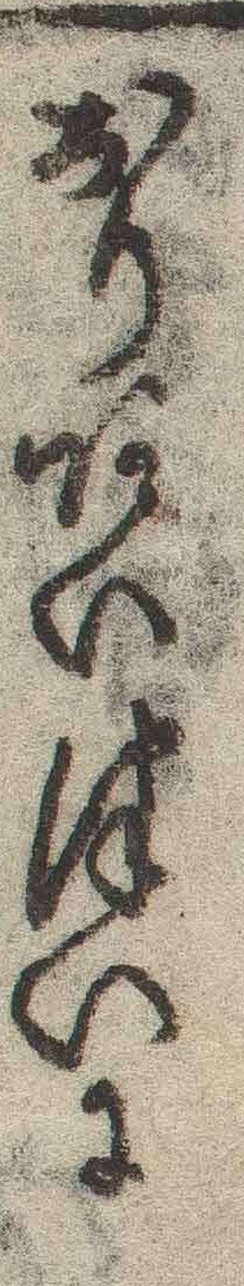おりあいついに
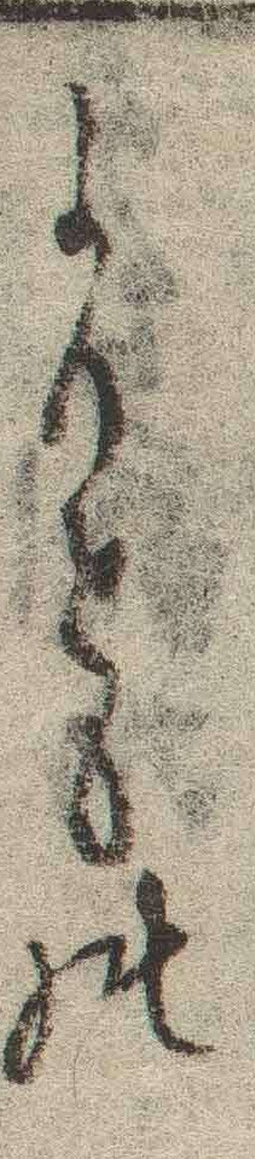よりともの
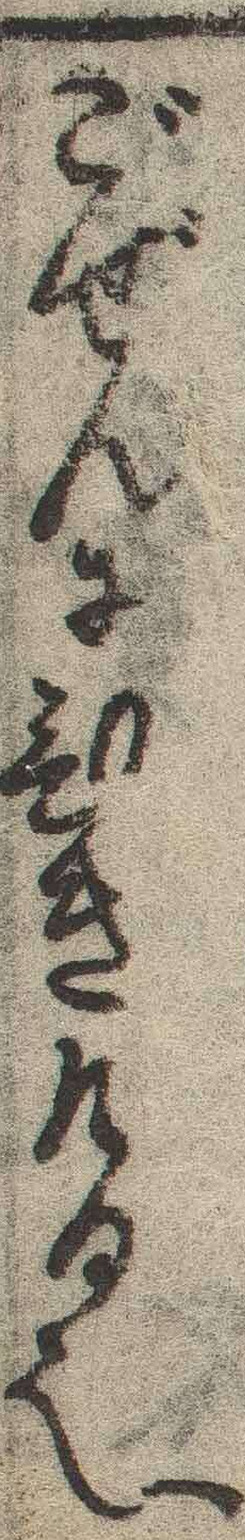ごぜんにひきける也

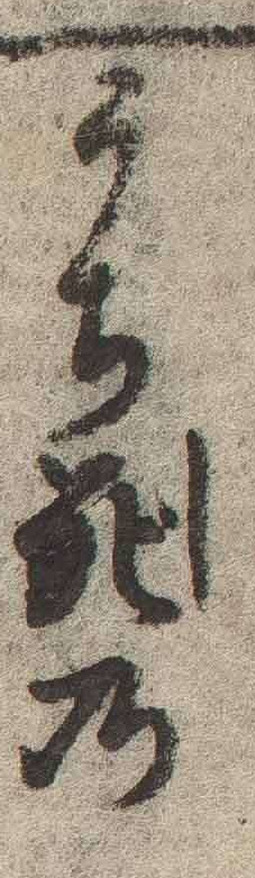うち死の
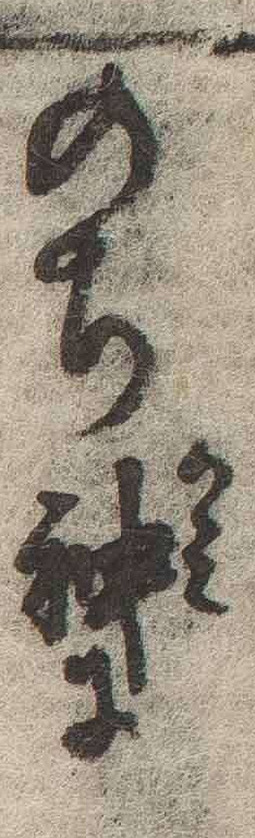のち神に
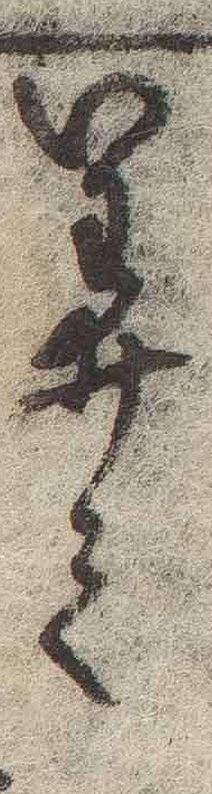いわゐて
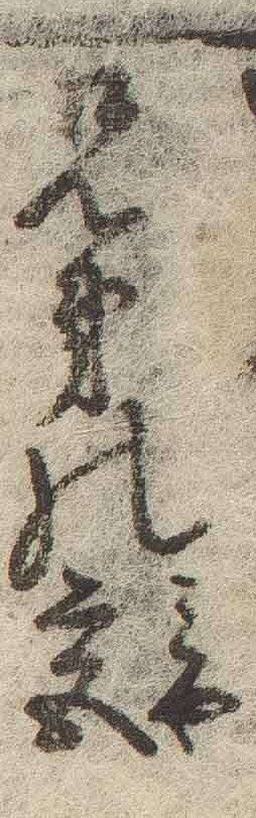兄弟の宮
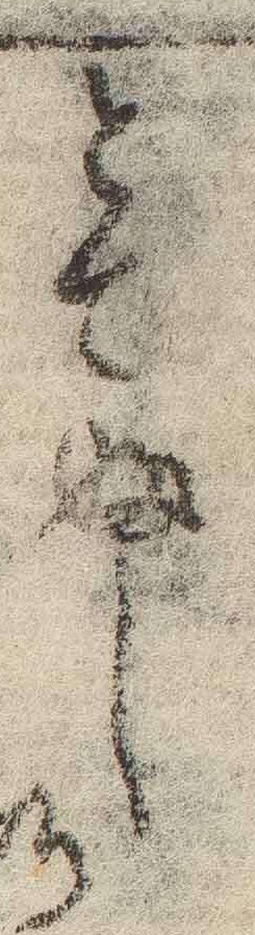とてふし
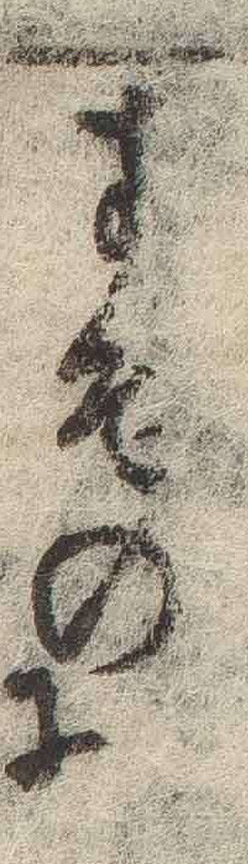すそのに
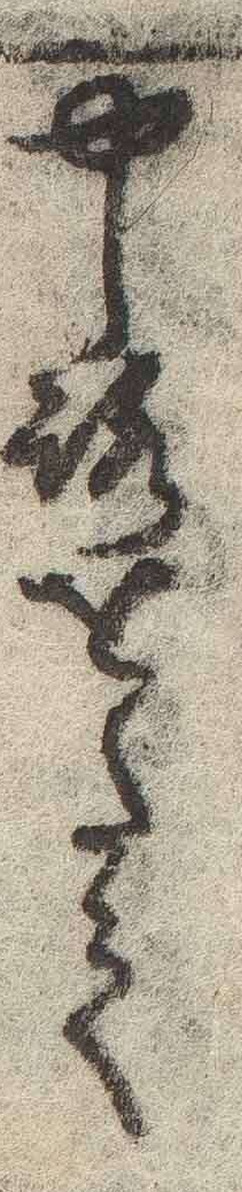やしろをたて
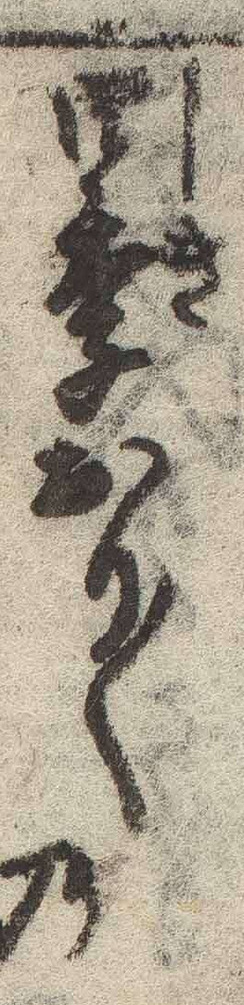四季おり〳〵の
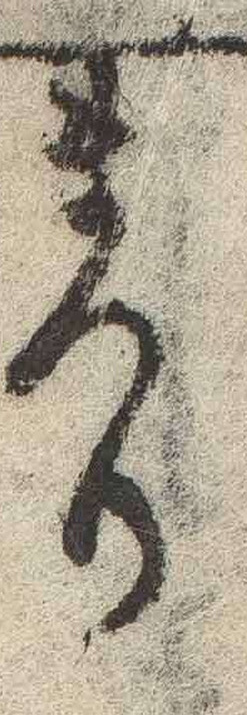まつり
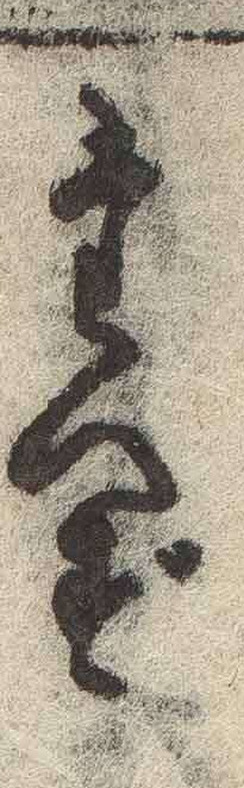たへず
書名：末広扇
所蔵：東京学芸大学附属図書館 国文学研究資料館
